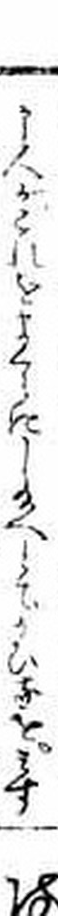申人がこれをまくらにし給へとてかいなをみす
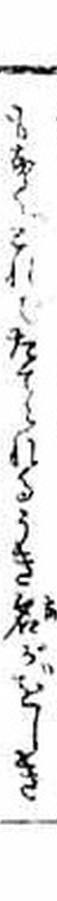もなくこれでたてられるうき名がをしき
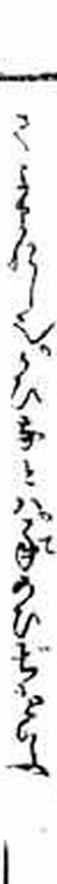てよまれし也かひなとは手のひぢといふ

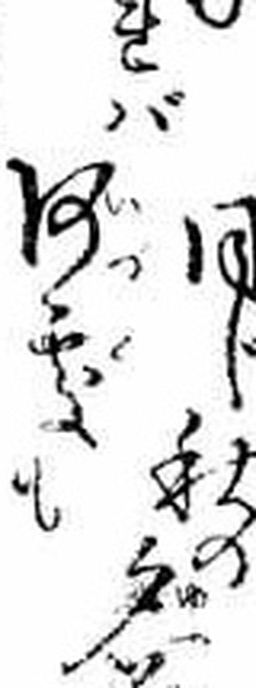何処も
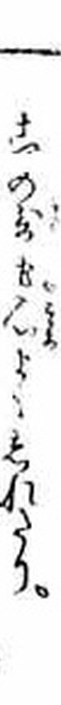この哥も心にてれたり
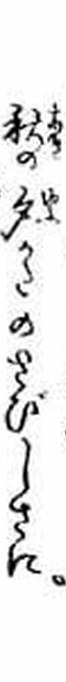秋の夕かたのさびしさに良暹
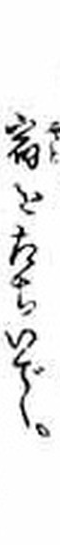宿をたちいでゝ
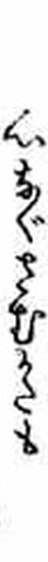心なぐさむかたも法
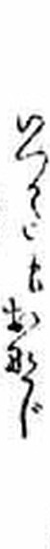いつかたもおなじ
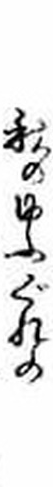秋のふゆぐれの
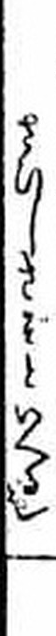さひしさぞといへる也
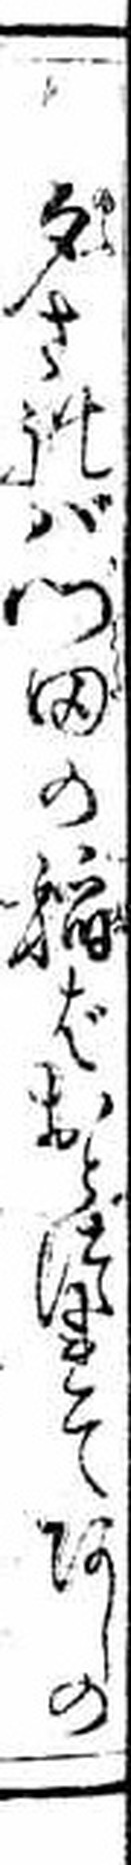夕されば門田の稲ばおとづれてあしの
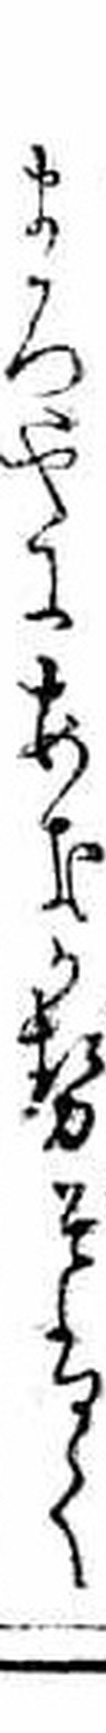まろやにあきかぜぞふく
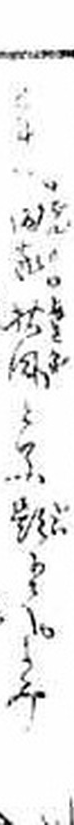これは秋風といふ題にてよみ
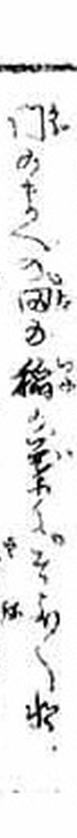門のまへの田の稲の葉にそよ〳〵と
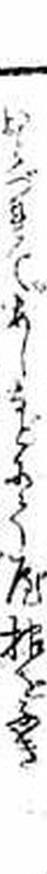おとづれてあしなどにて屋根をふき
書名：小倉百人一首
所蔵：東京学芸大学教育コンテンツアーカイブ
